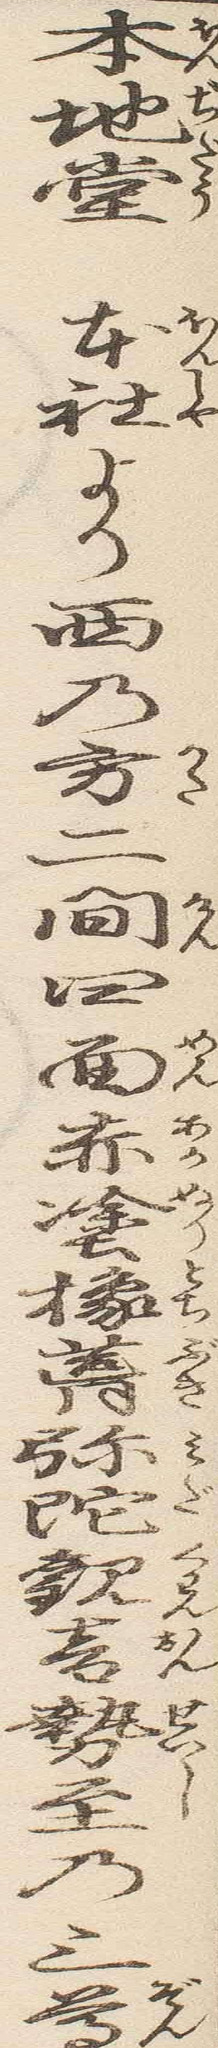本地堂本社より西の方二間四面赤塗橡葺弥陀觀音勢至の三尊
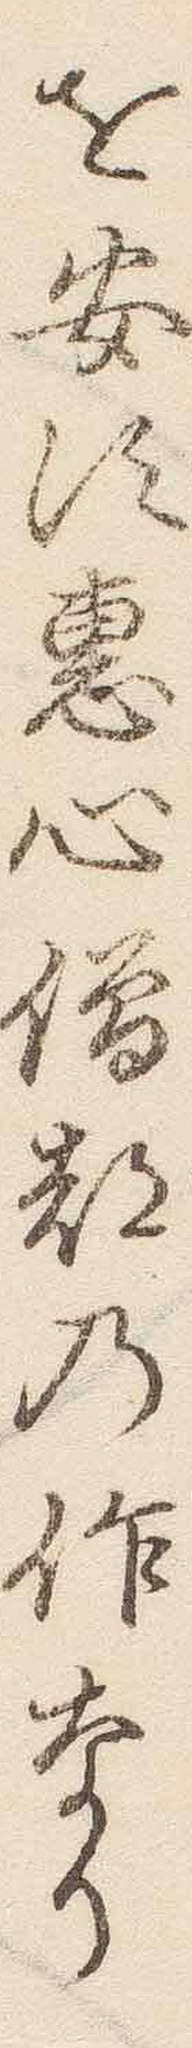を安す惠心僧都の作なり
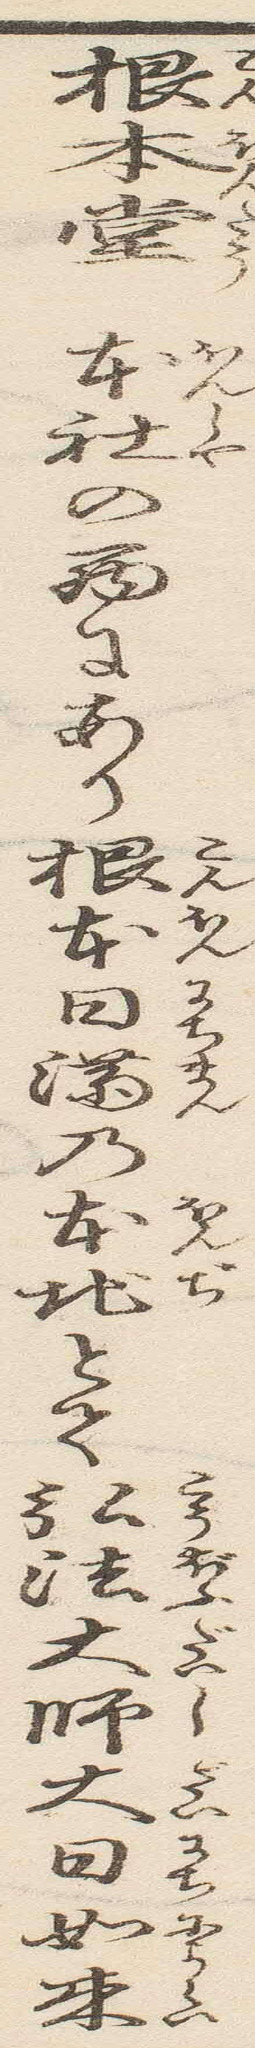根本堂本社の西にあり根本日満の本地とて弘法大師大日如來
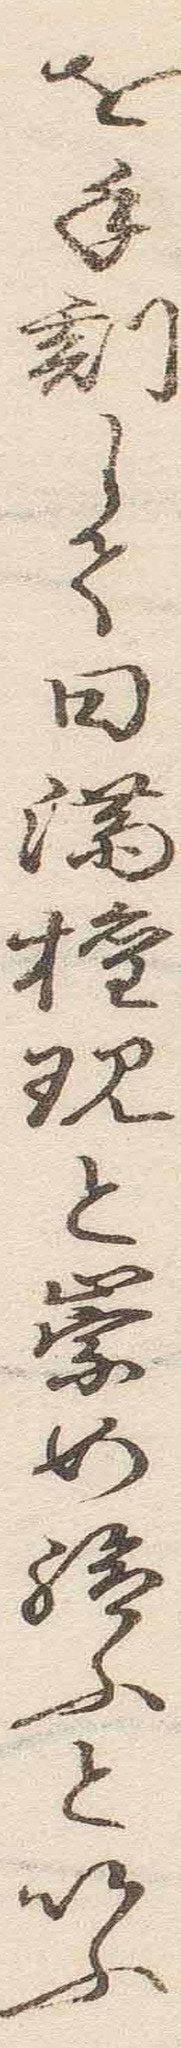を手刻して日満權現と崇め給ふといふ
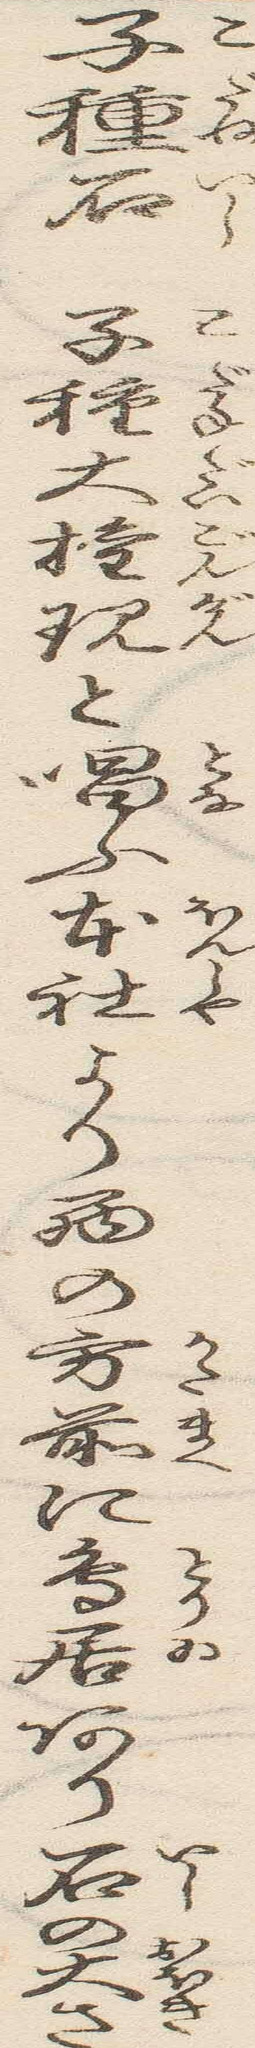子種石子種大權現と唱ふ本社より西の方前に鳥居あり石の大さ
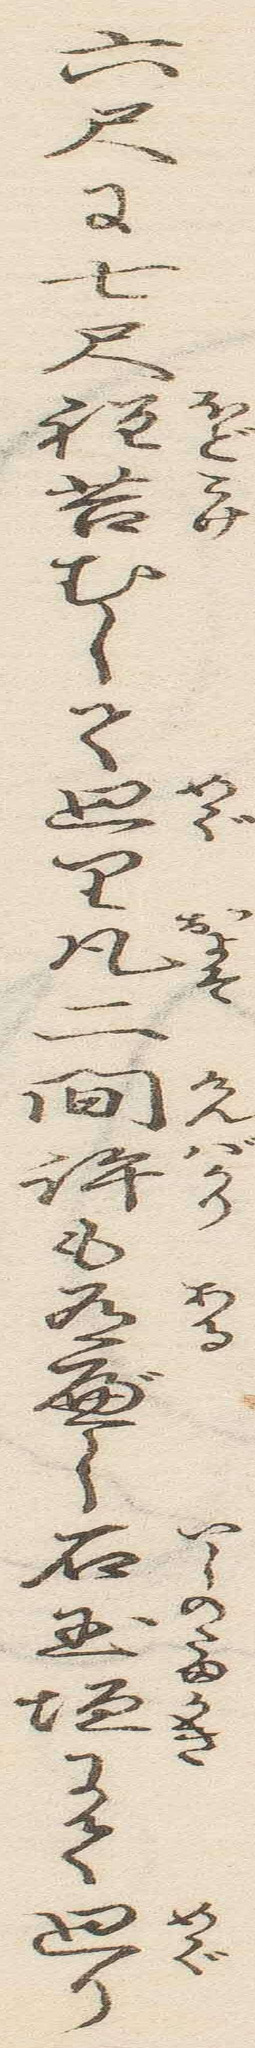六尺に七尺程苔むして廻り凡二間許も有べし石玉垣にて廻り
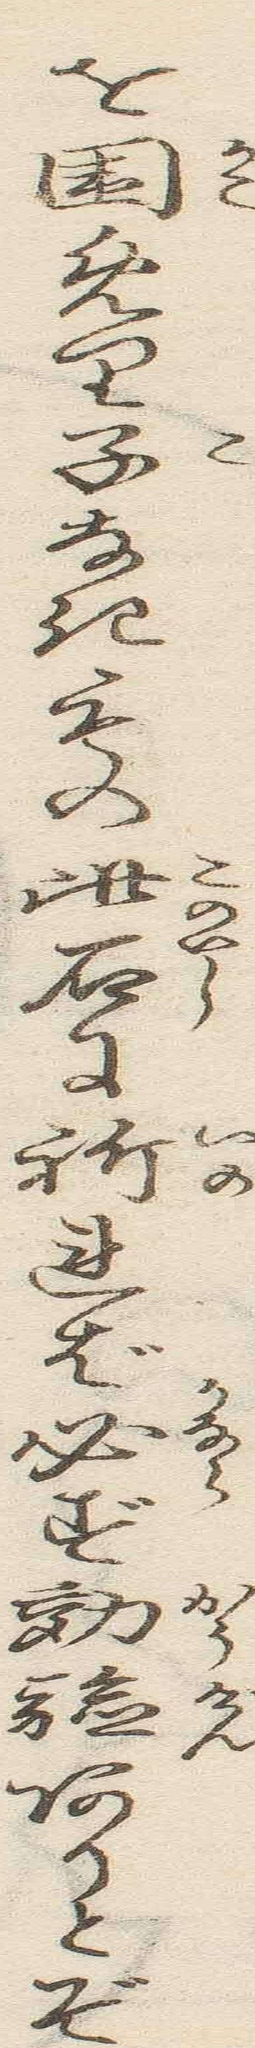を圍めり子なきもの此石に祈れば必ず効驗ありとぞ
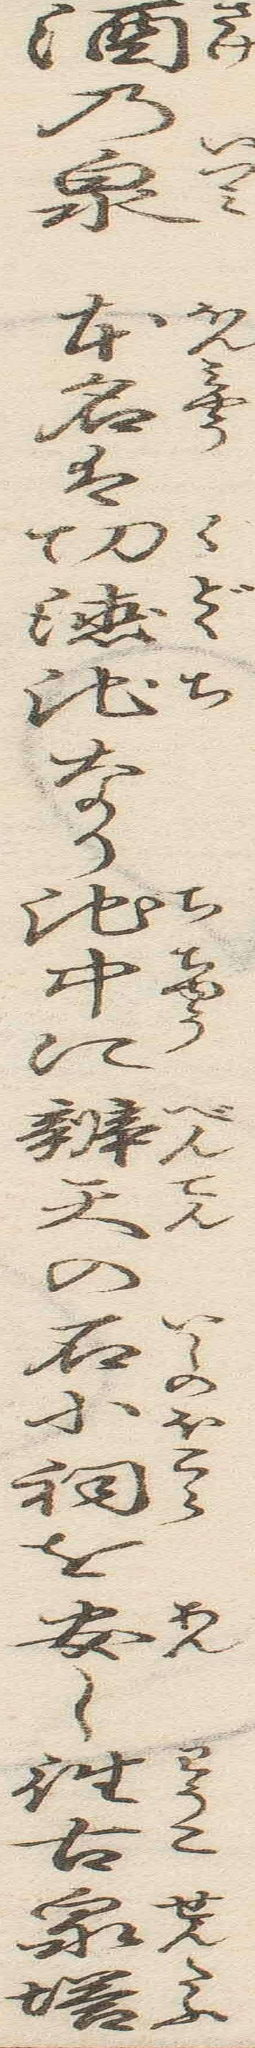酒の泉本名は㓛徳池なり池中に辨天の石小祠を安し徃古泉塔
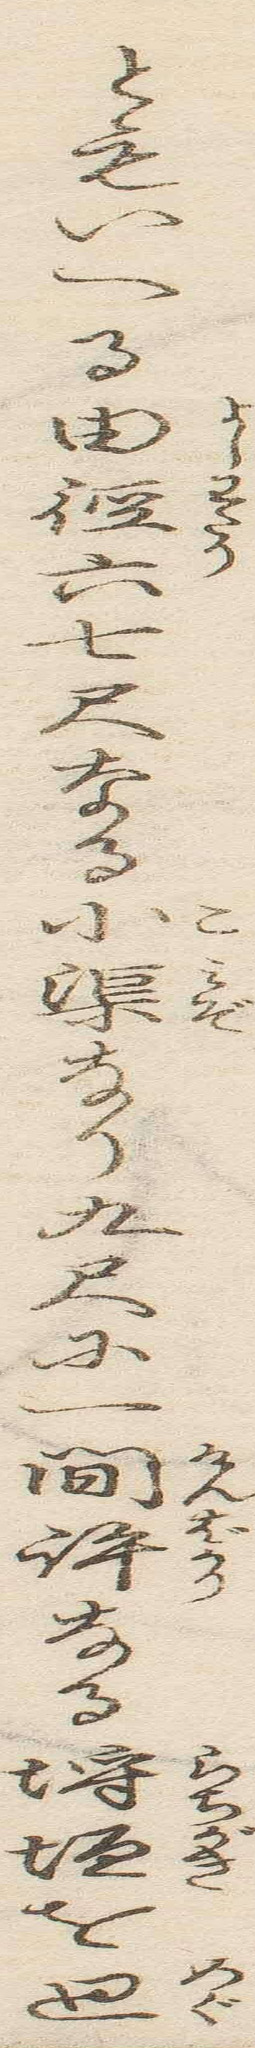ともいへる由徑六七尺なる小渠なり九尺に一間許なる埒垣を廻
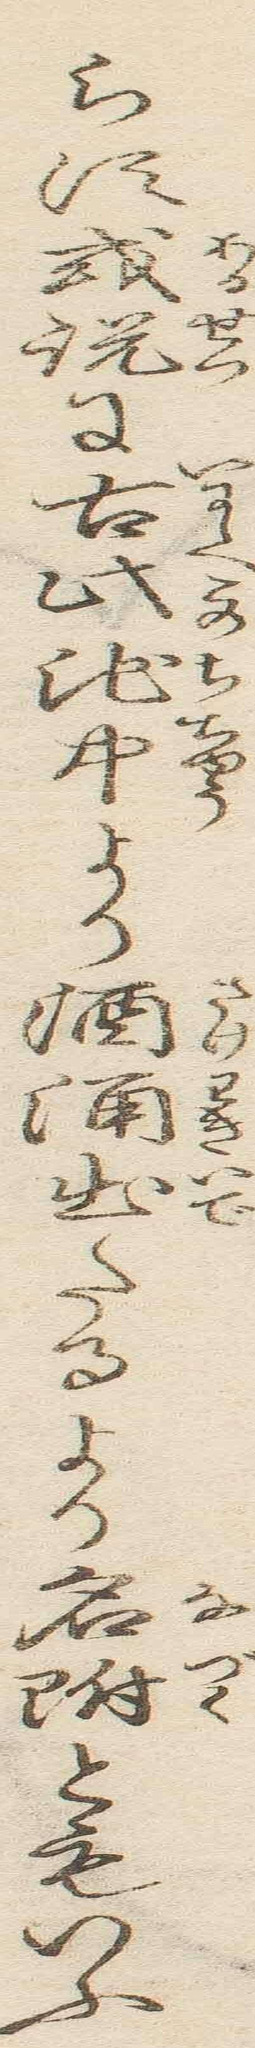らす或説に古此池中より酒涌出たるより名附ともいふ
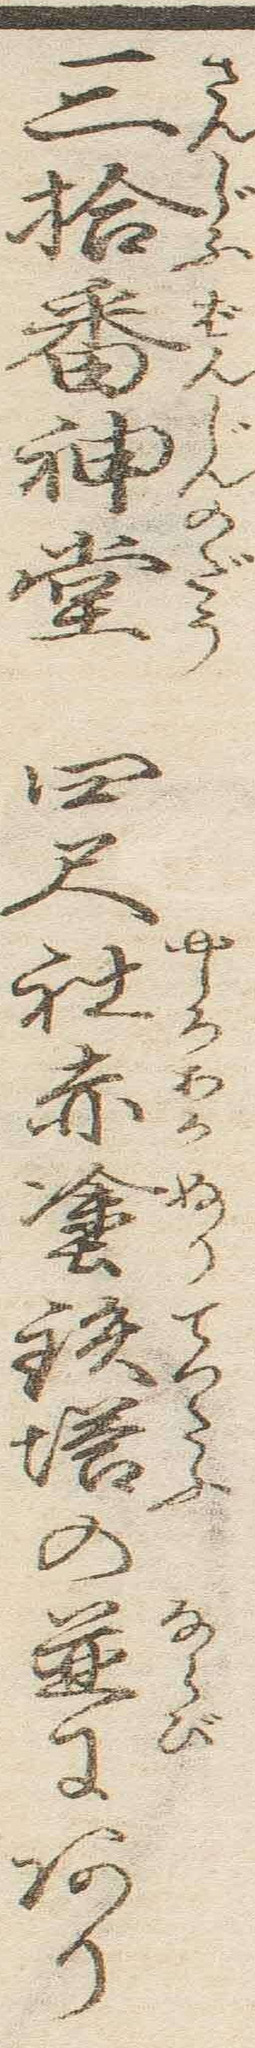三拾番神堂四尺社赤塗鉄塔の並にあり
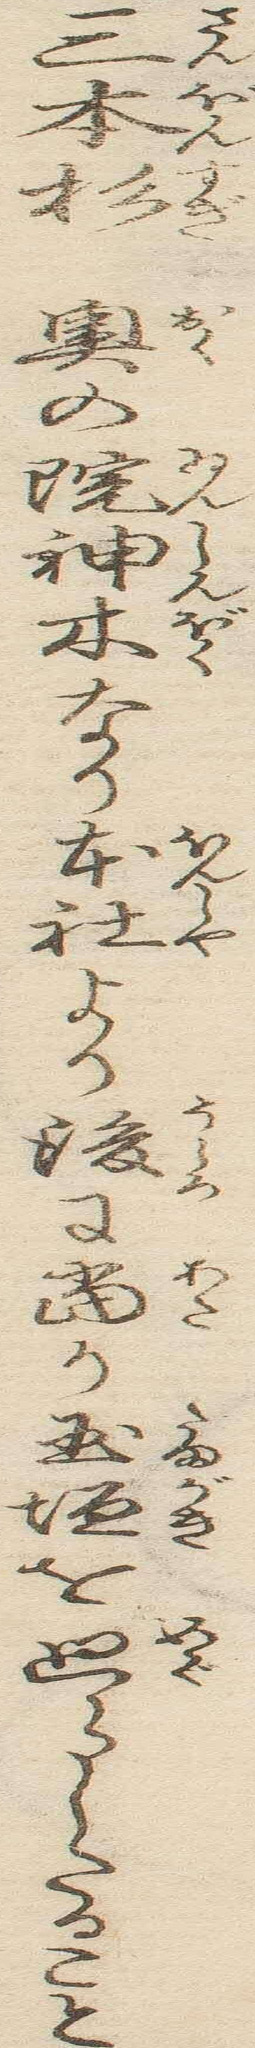三本杉奥の院神木なり本社より後に當り玉垣を廻らしたること

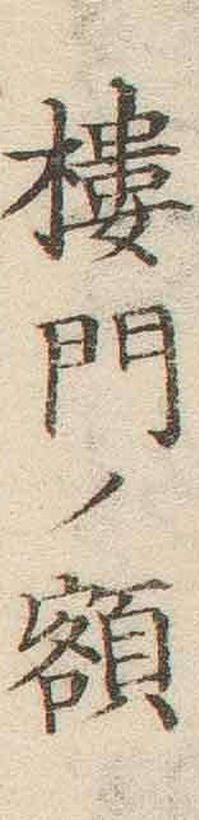樓門ノ額
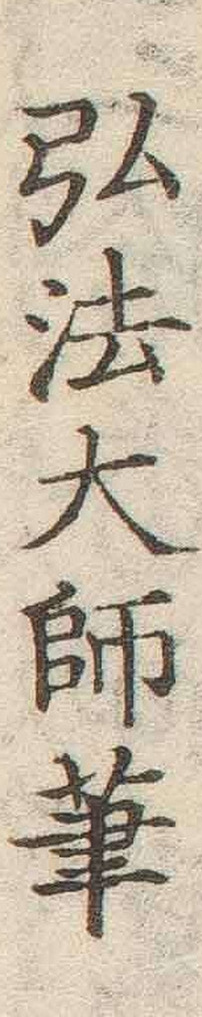弘法大師筆

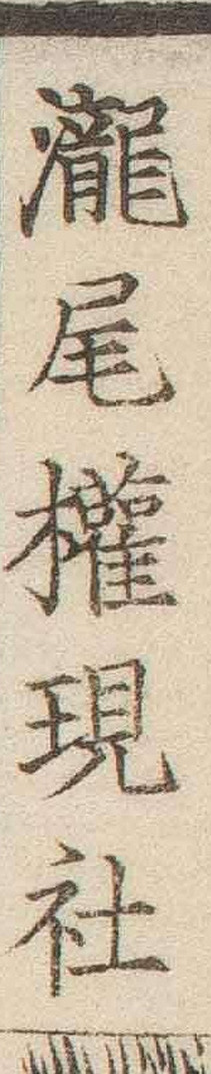瀧尾權現社

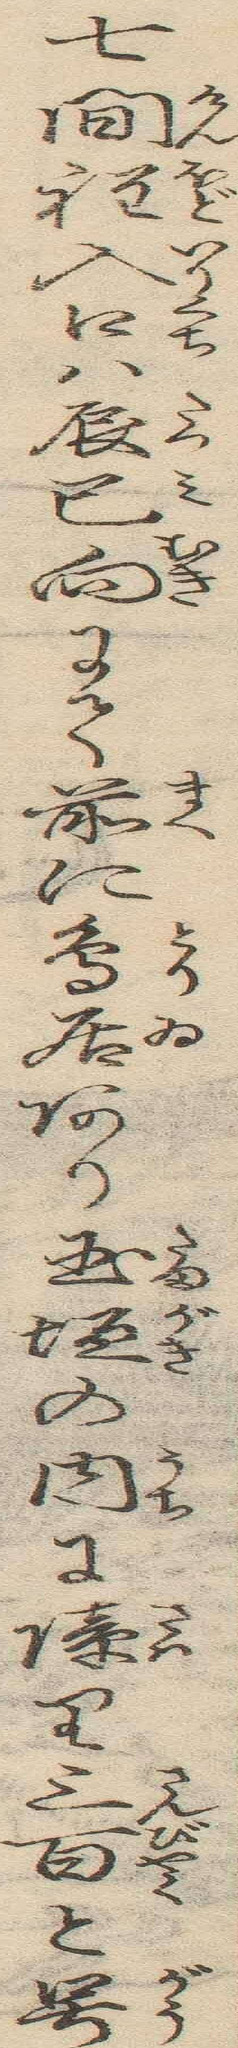七間程入口は辰巳向にて前に鳥居あり玉垣の内に障り三百と号
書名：日光山志
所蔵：東京学芸大学附属図書館 国文学研究資料館
